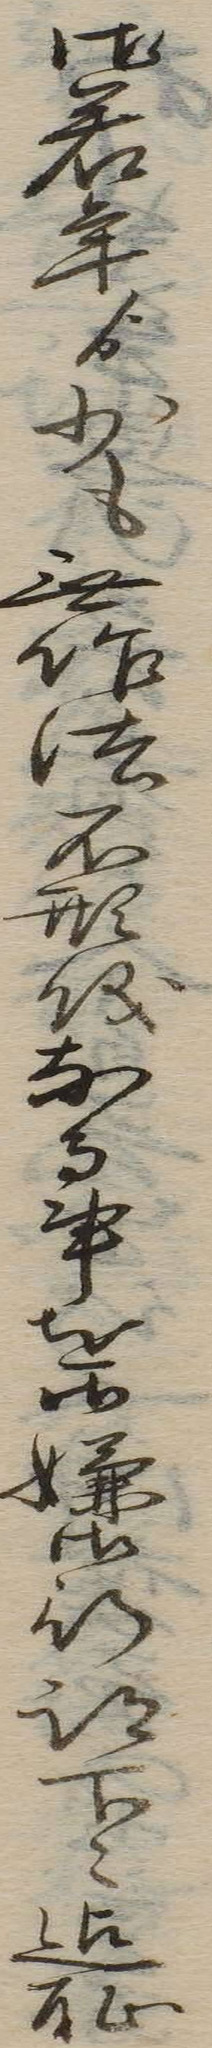御若年ゟ少も無作法不形儀なる事を御嫌御行跡下々迄恥
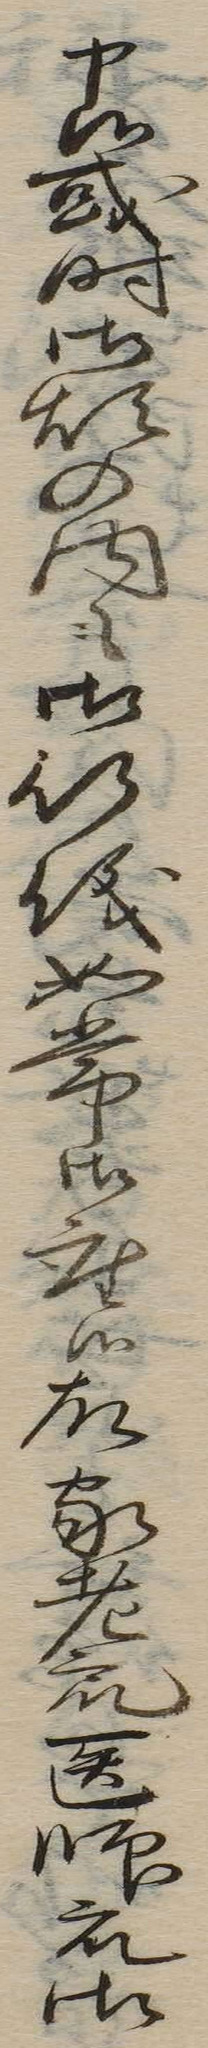申候或時御煩の内も御行儀如常御坐候故家老衆医師衆御
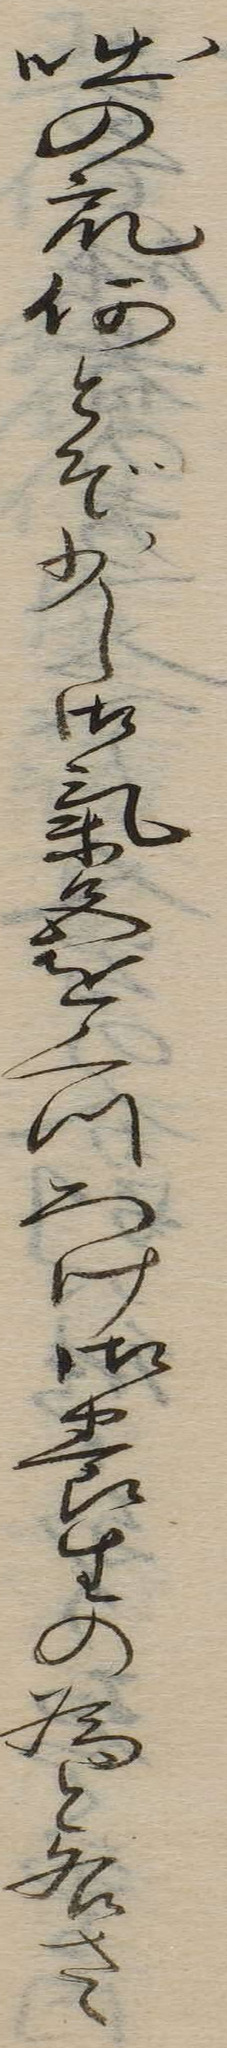咄の衆何とぞ少し御気色をくつろけ御養生の為と各さゝ
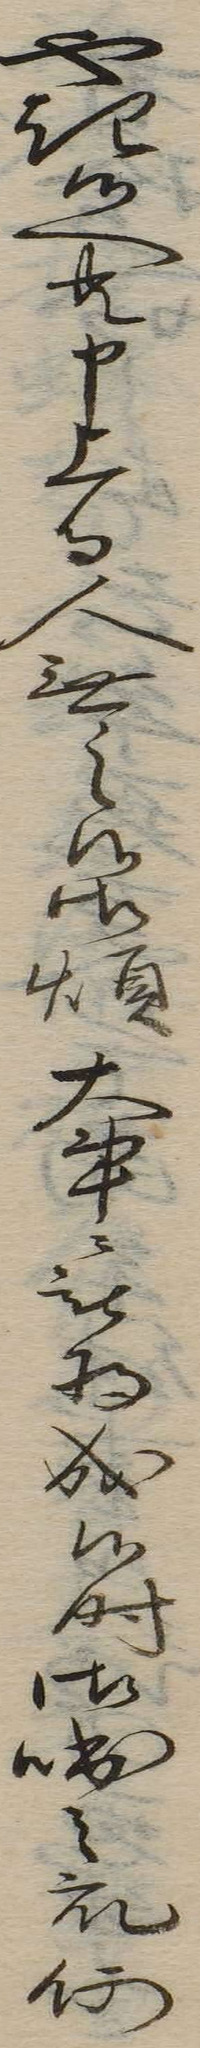やき候へ共申上る人無之候御煩大事ニ被為成候時御咄之衆何
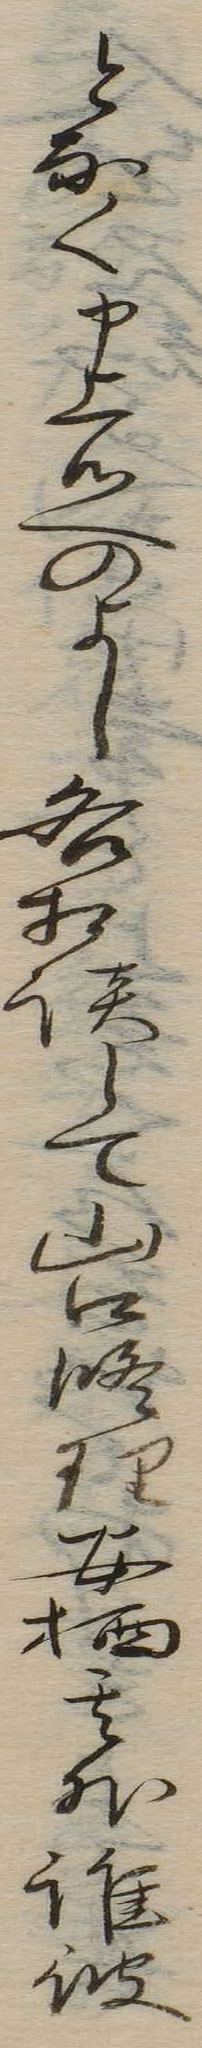となく申上候へのよし各相談して山口修理安栖其外誰彼
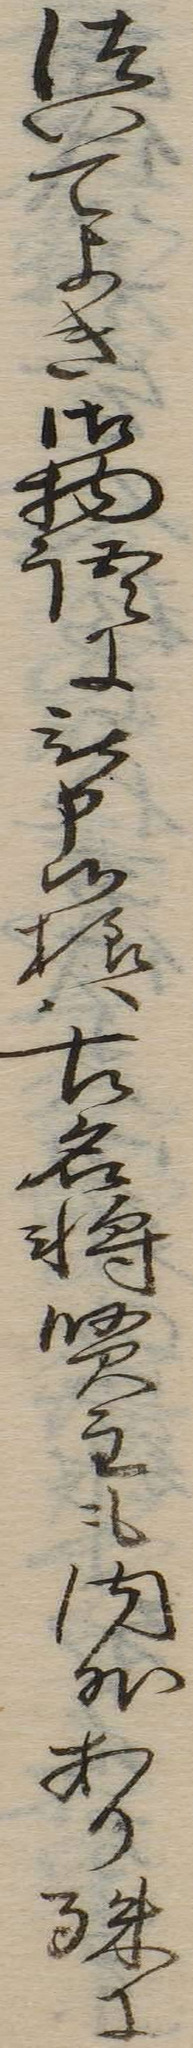ついてよき御物語に被申候様ハ古名将賢主も内外あり殊に
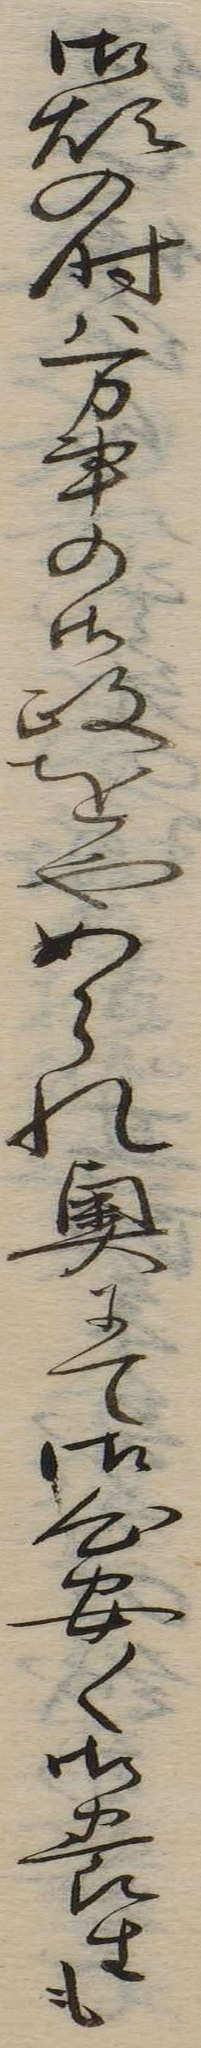御煩の時は万事の御政をやめられ奥にて御心安く御養生も
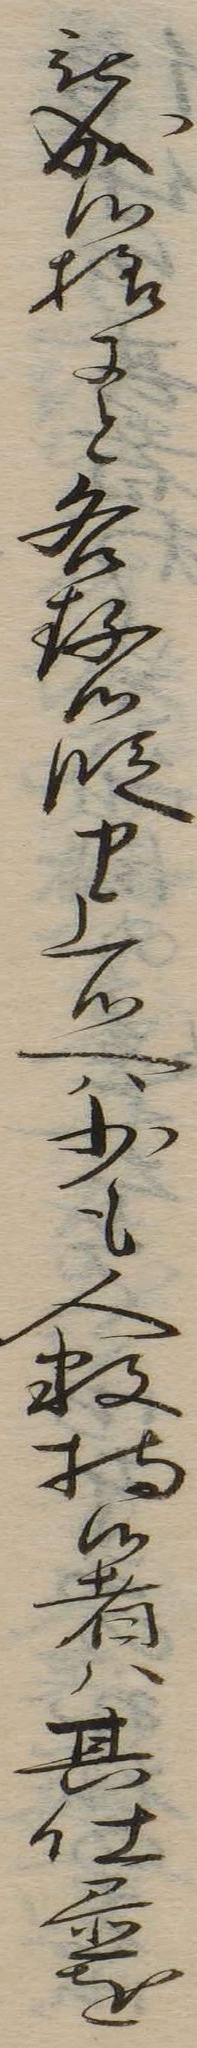被成候様にと各存候段申上候へは少も人数持候者は其仕置を
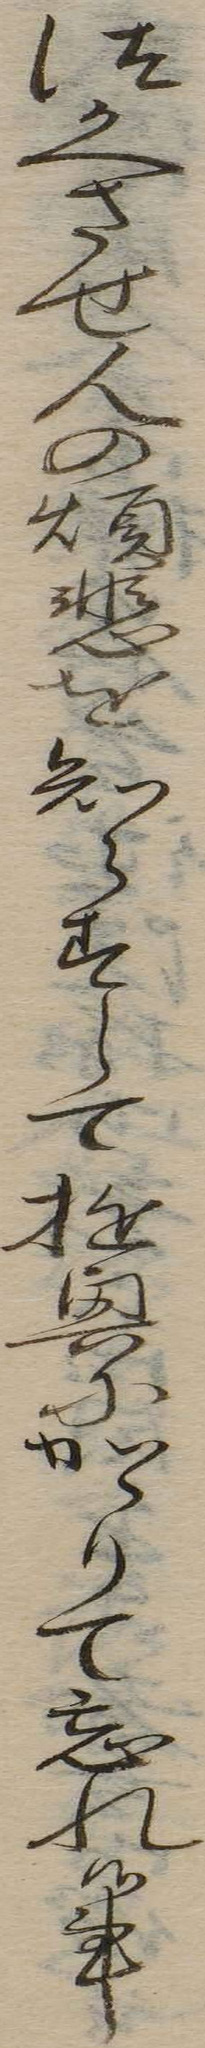つかへさせ人の煩悲を知らすして遊興にかゝりて忘れ候事
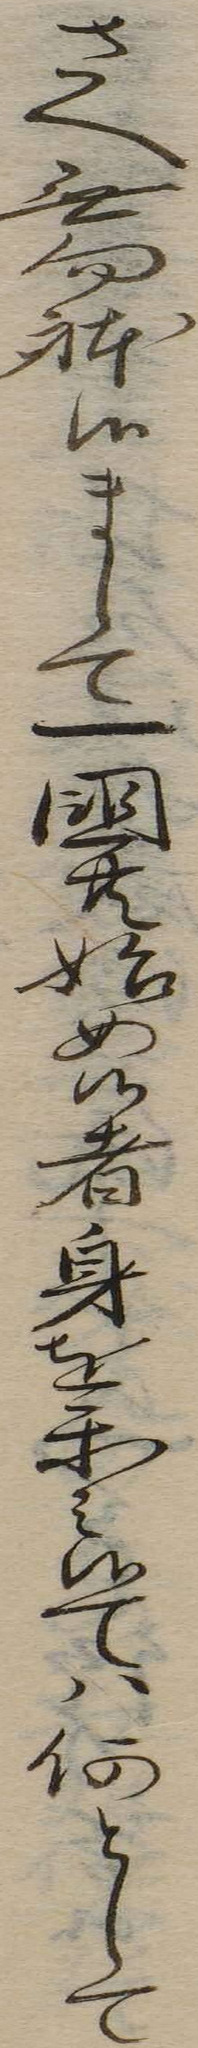さへ無勿体候まして一国共始め候者身を楽み候ては何として
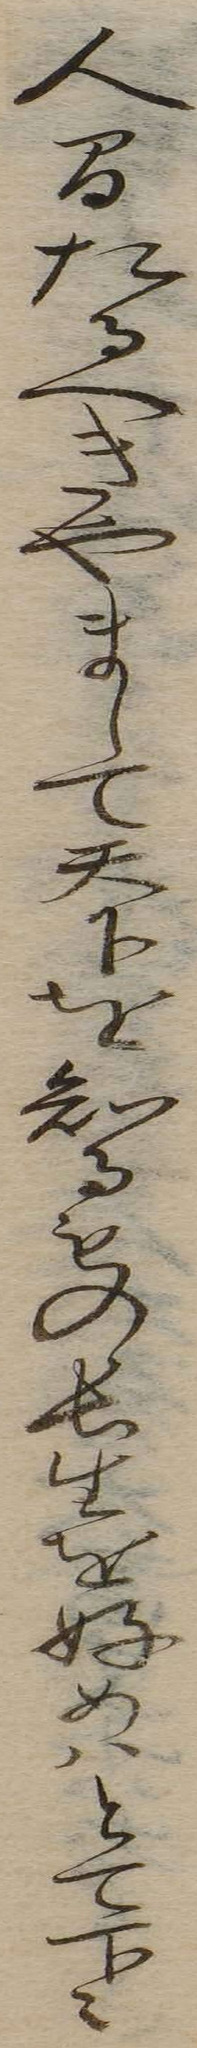人間たるへきやまして天下を知るもの長生を好めはとて下々

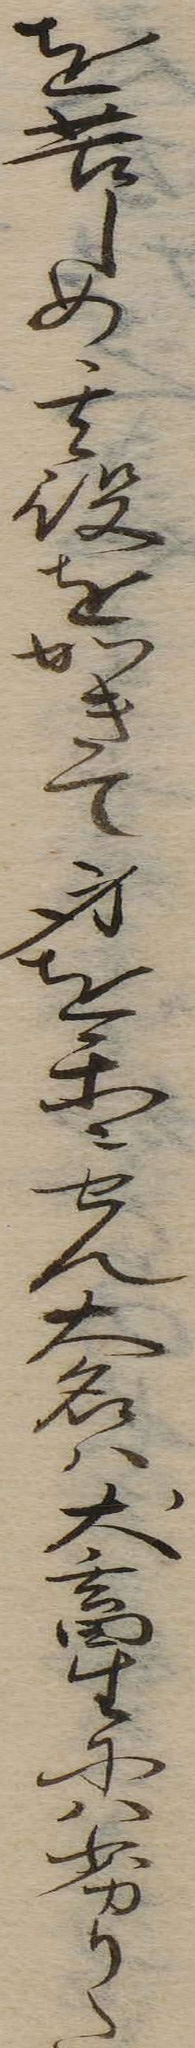を苦しめ其役をかきて身を楽にせん大名は犬畜生に劣りた
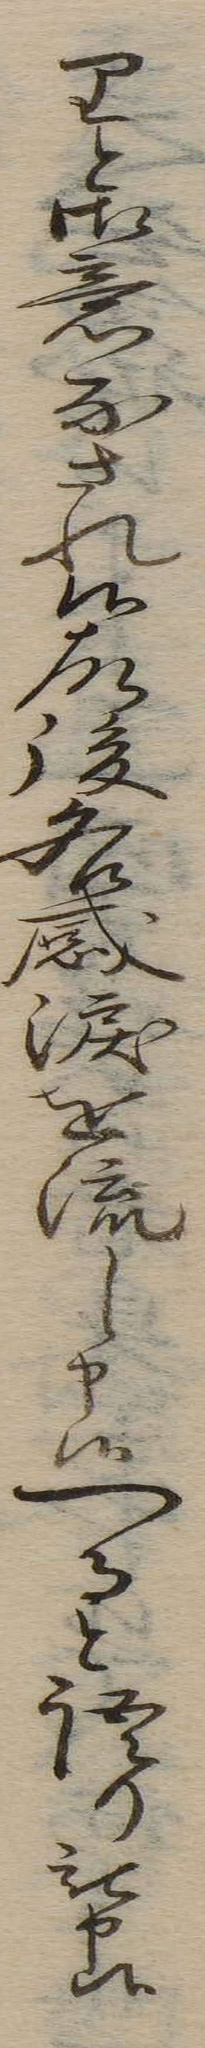りと御意なされ候故後各感涙を流し申候つると語り被申候
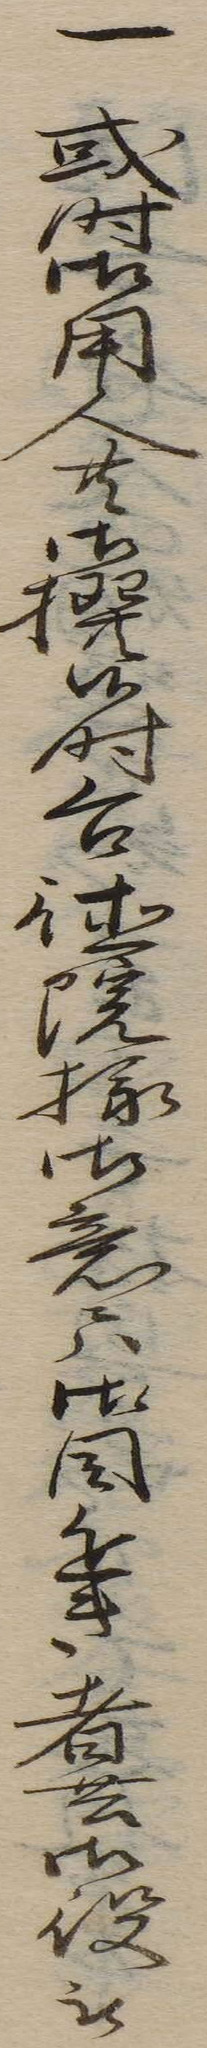一或時御用人共御撰候時台徳院様御意ニは御目近き者共御役被
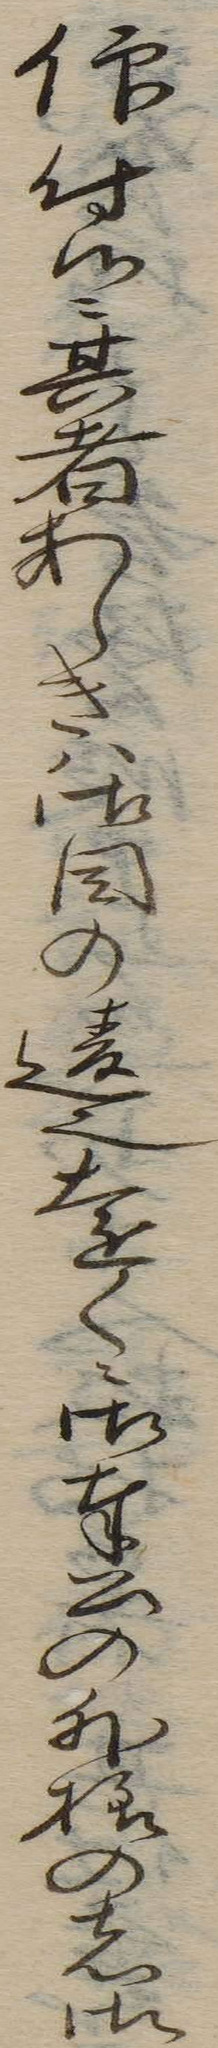仰付候ニ其者あしきは御目の遠也遠くニ御奉公の外様の者御
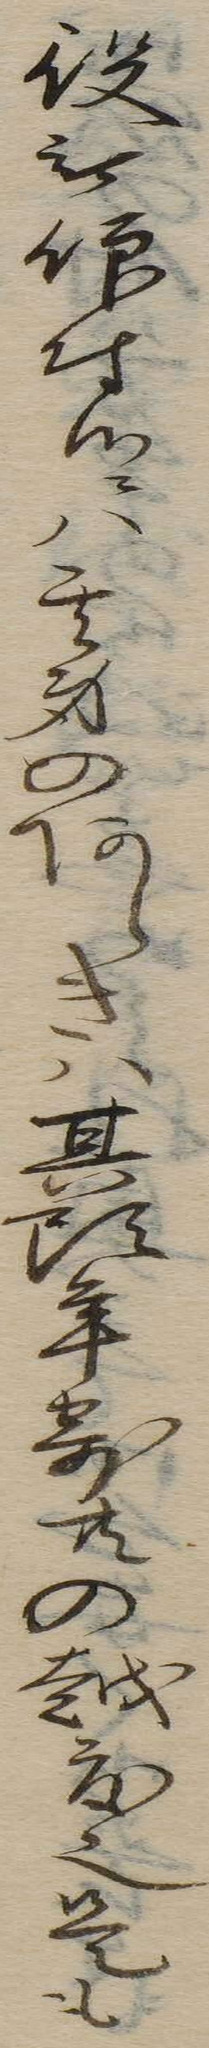役被仰付候ニは其身のあしきは其頭年寄共の越度也是も
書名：三河之物語
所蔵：国文学研究資料館
